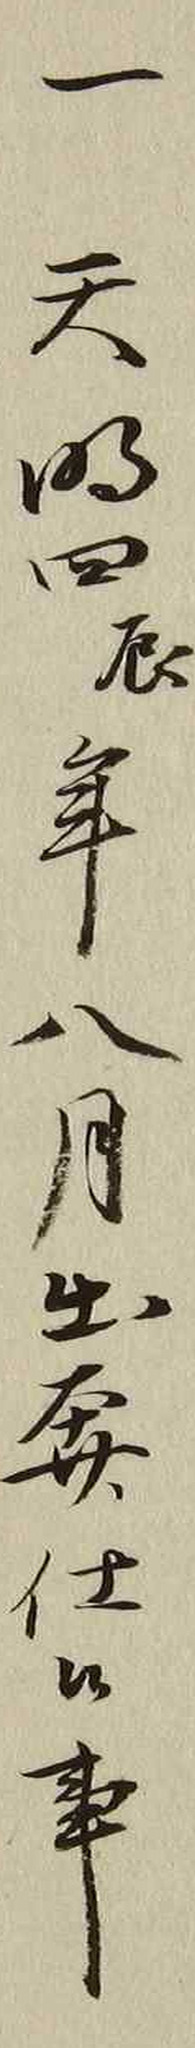一天明四辰年八月出奔仕候事
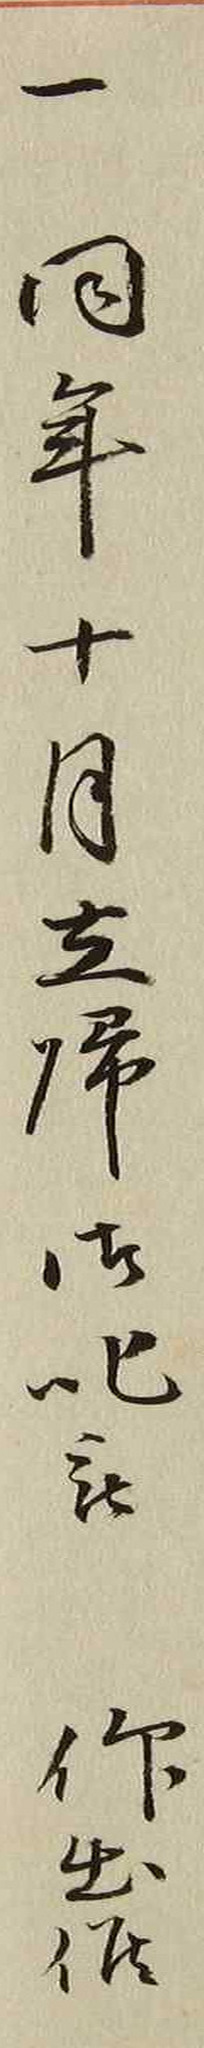一同年十月立帰御叱被仰出候
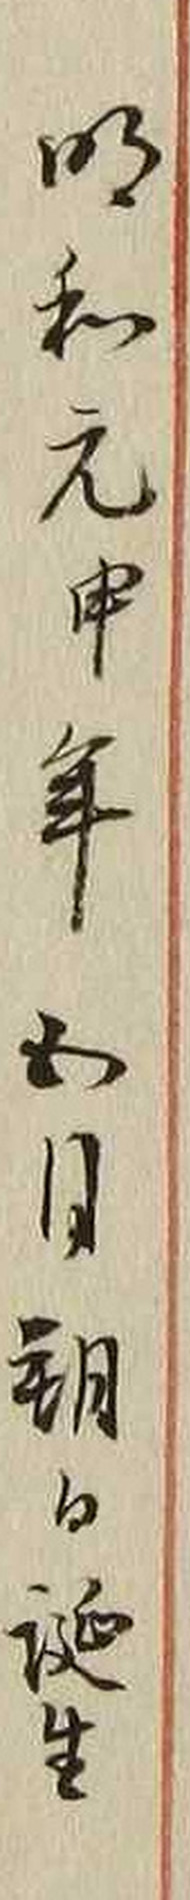明和元申年五月朔日誕生
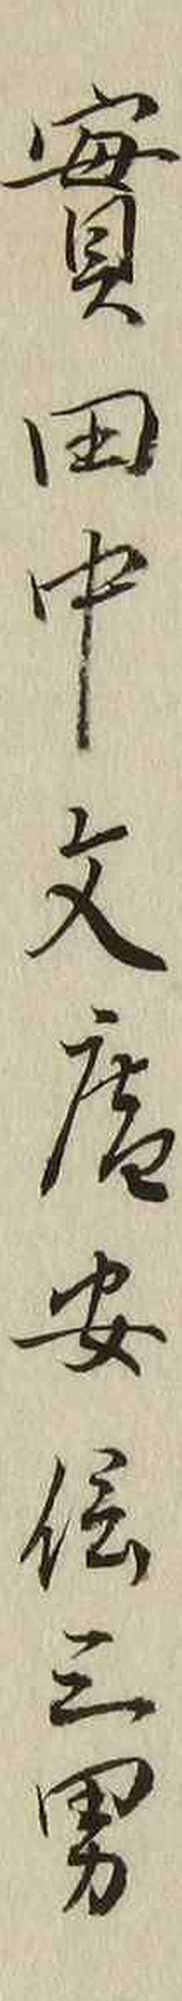実田中文庵安信三男
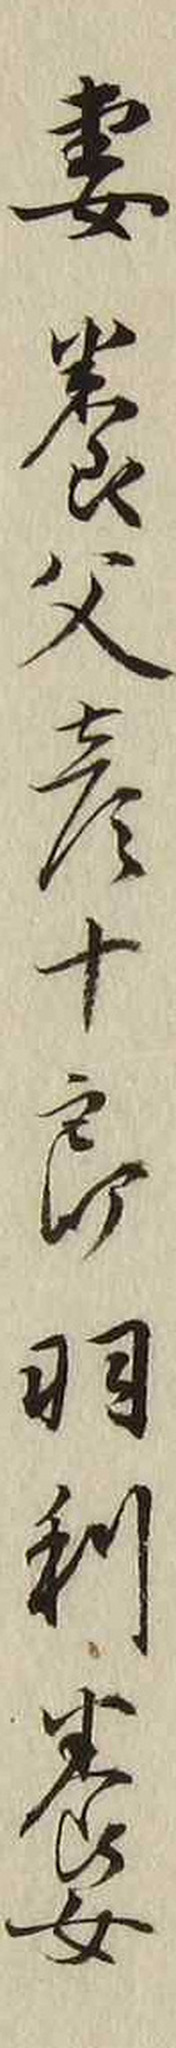妻養父彦十郎羽利養女
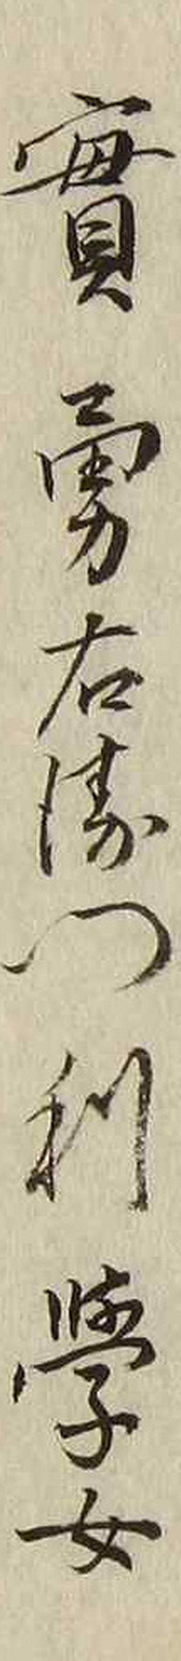実勇右衛門利学女
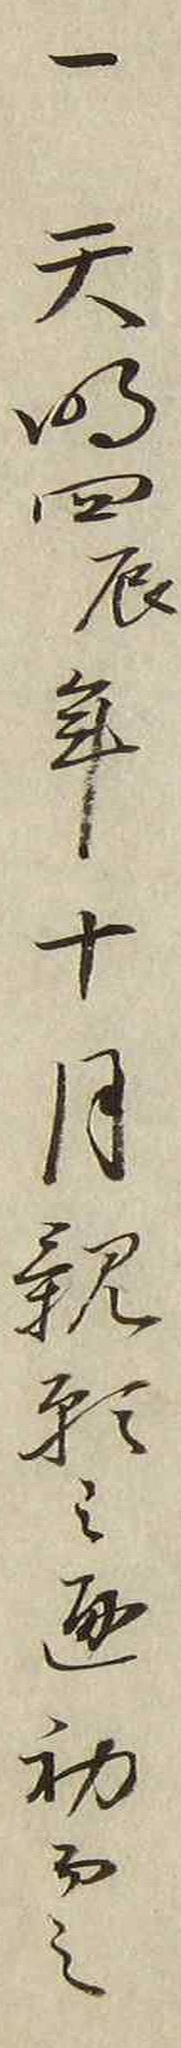一天明四辰年十月親願之通初而之

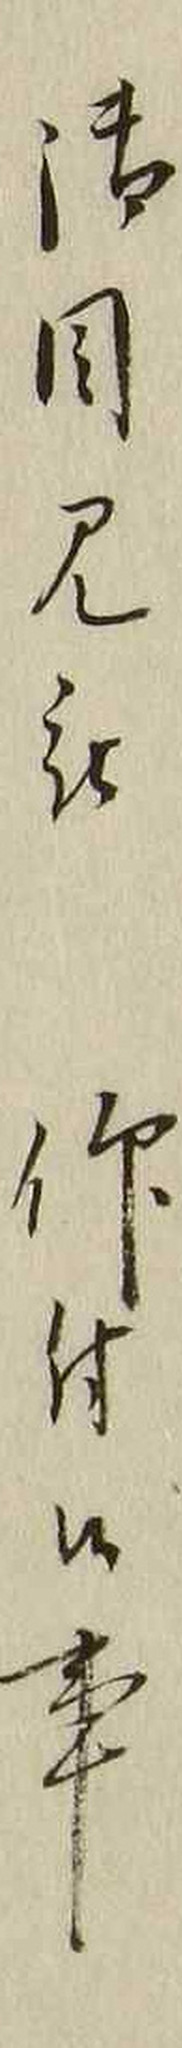御目見被仰付候事
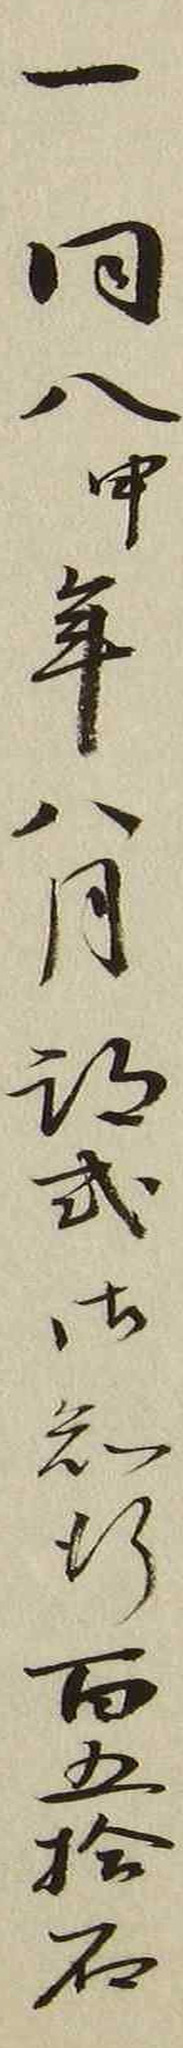一同八申年八月跡式御知行百五拾石
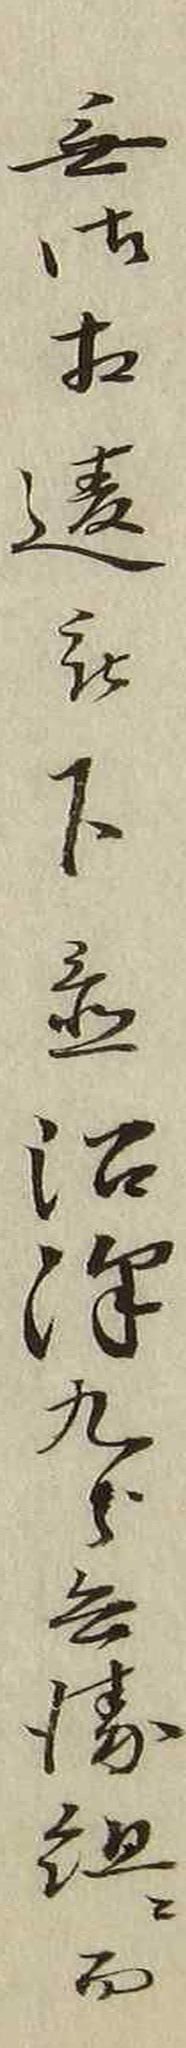無御相違被下置沼沢九郎兵衛組ニ而
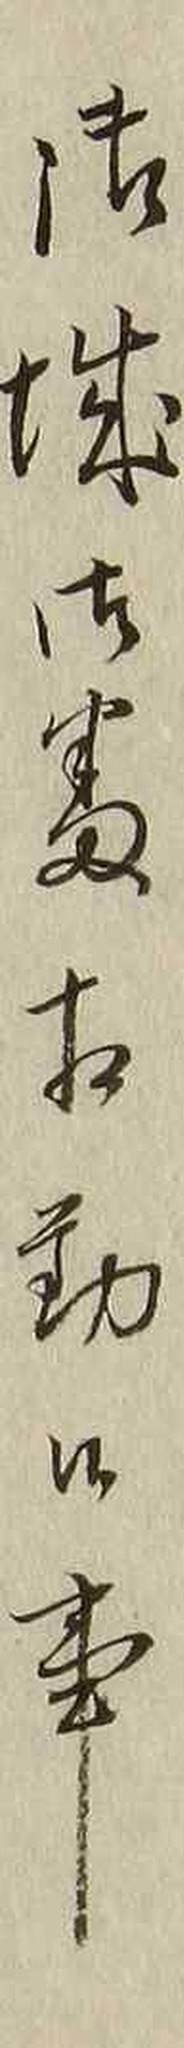御城御番相勤候事
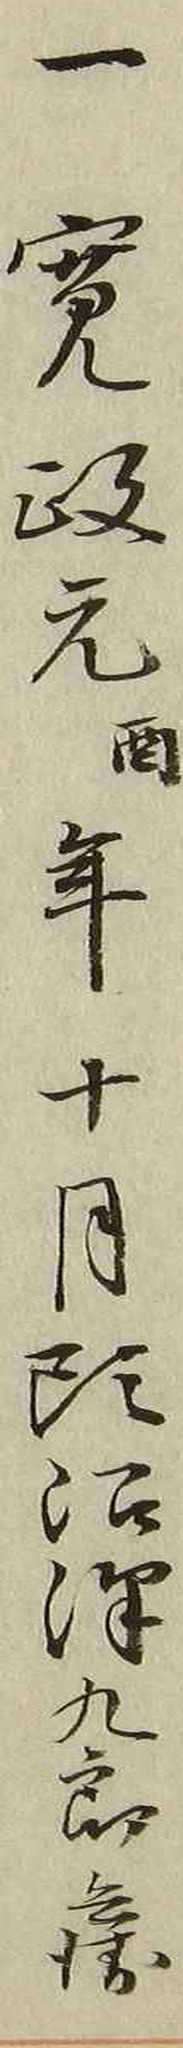一寛政元酉年十月頭沼沢九郎兵衛
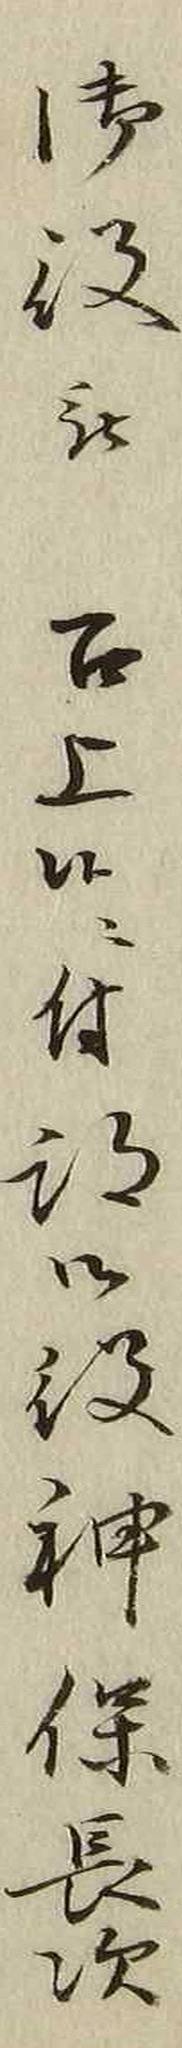御役被召上候ニ付跡御役神保長次
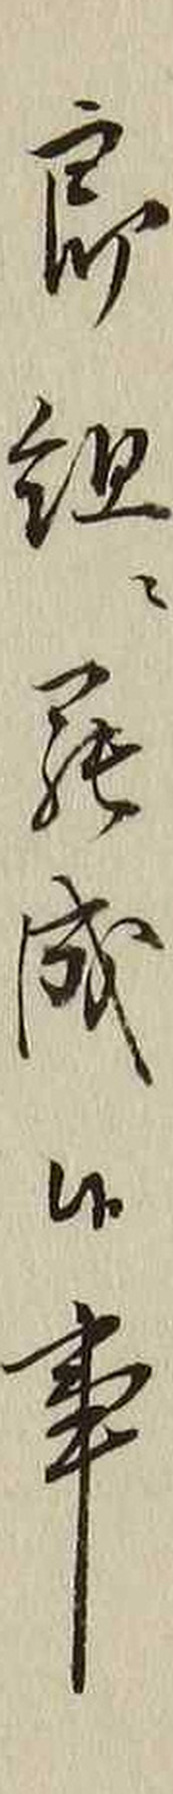郎組ニ罷成候事
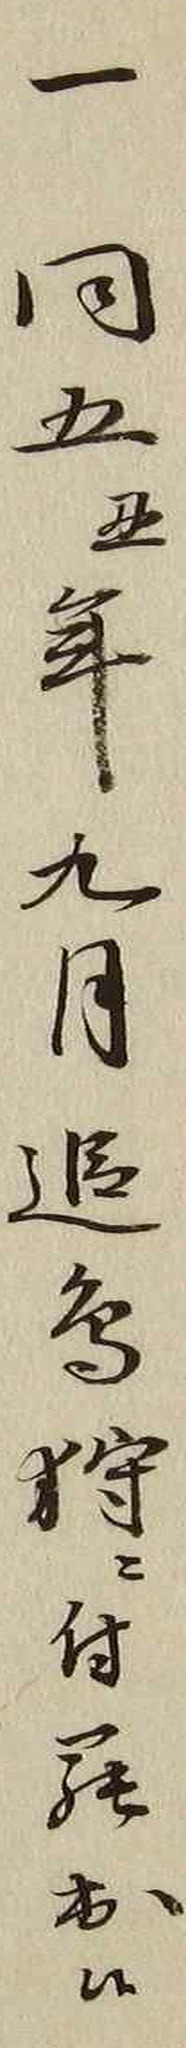一同五丑年九月追鳥狩ニ付罷出候
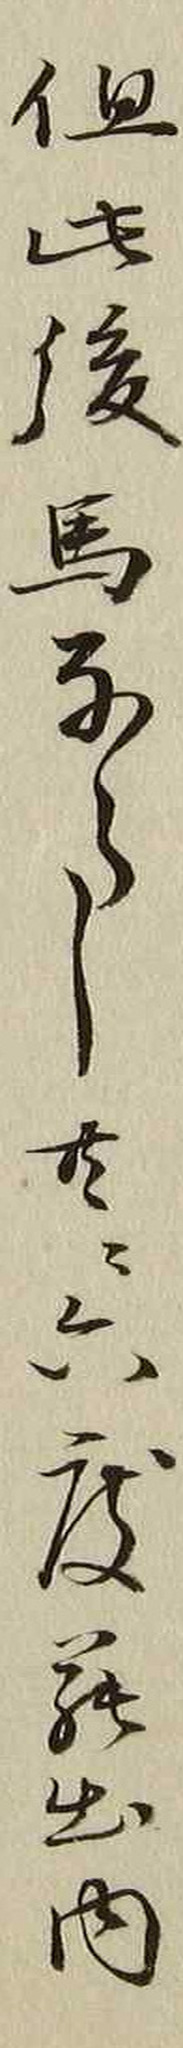但此後馬ならし共ニ六度罷出内
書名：諸士系譜　巻之22　い之部22
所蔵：会津若松市立会津図書館
